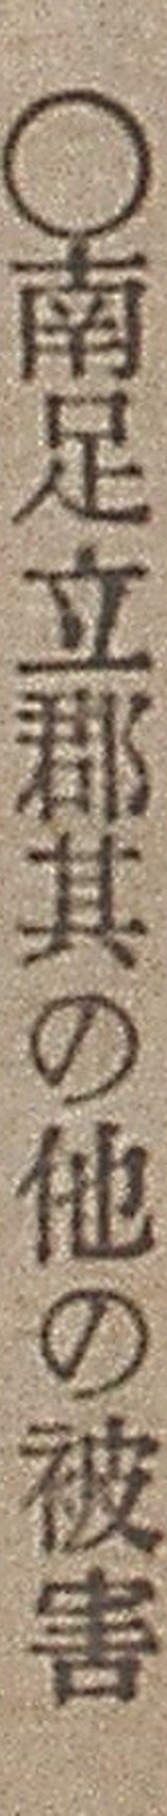〇南足立郡其の他の被害
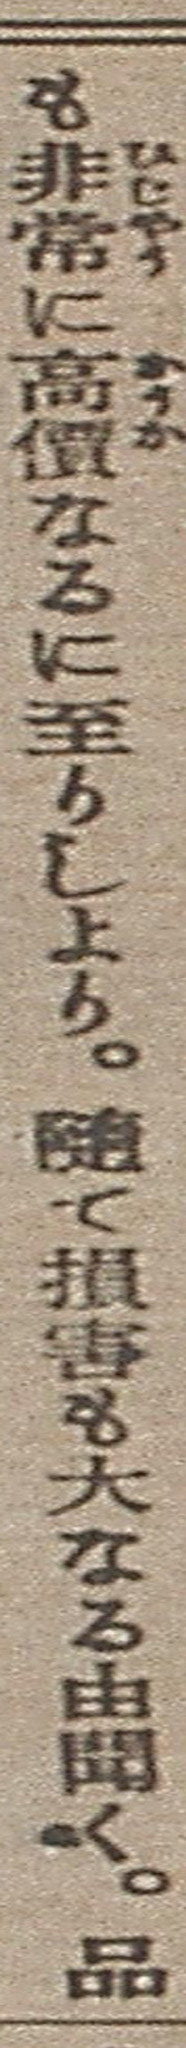も非常に高価なるに至りしより。随て損害も大なる由聞く。品
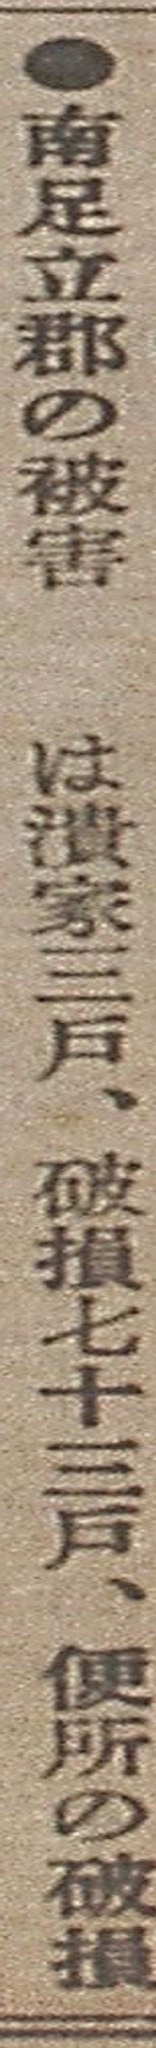●南足立郡の被害は潰家三戸、破損七十三戸、便所の破損
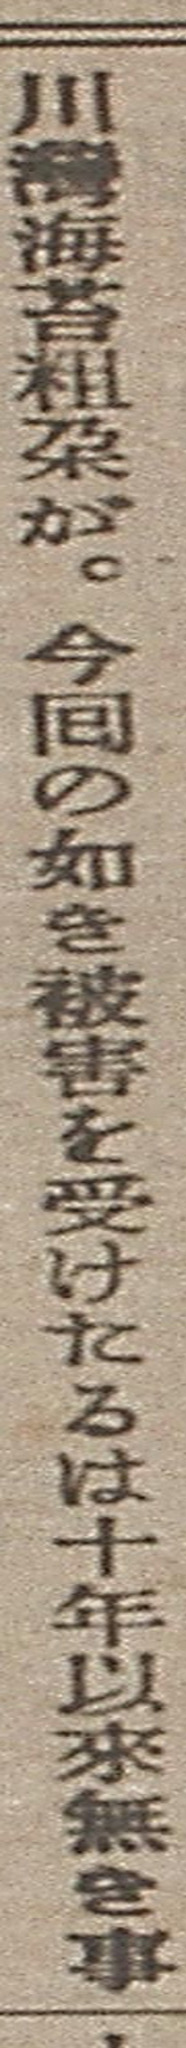川湾海苔粗朶が。今回の如き被害を受けたるは十年以来無き事
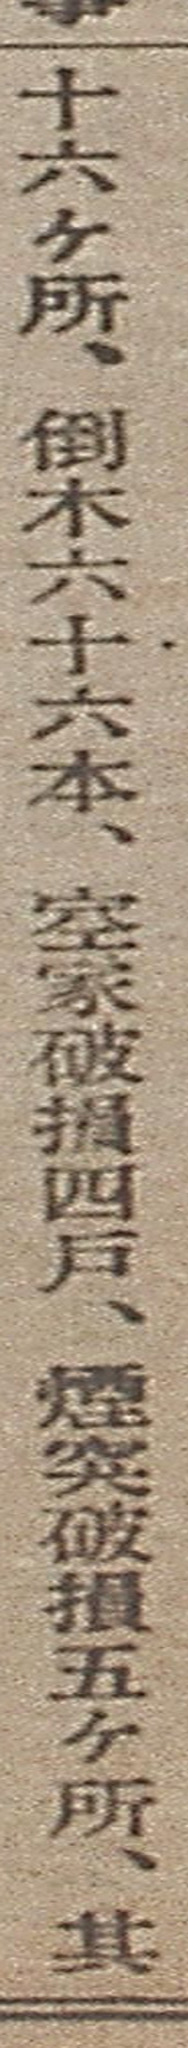十六ケ所、倒木六十六本、空家破損四戸、煙突破損五ケ所、其
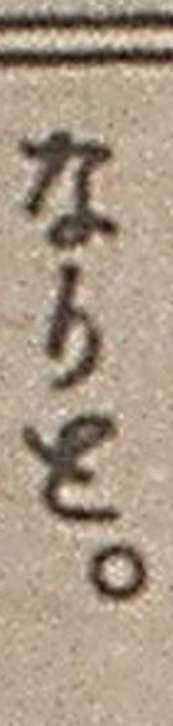なりと。
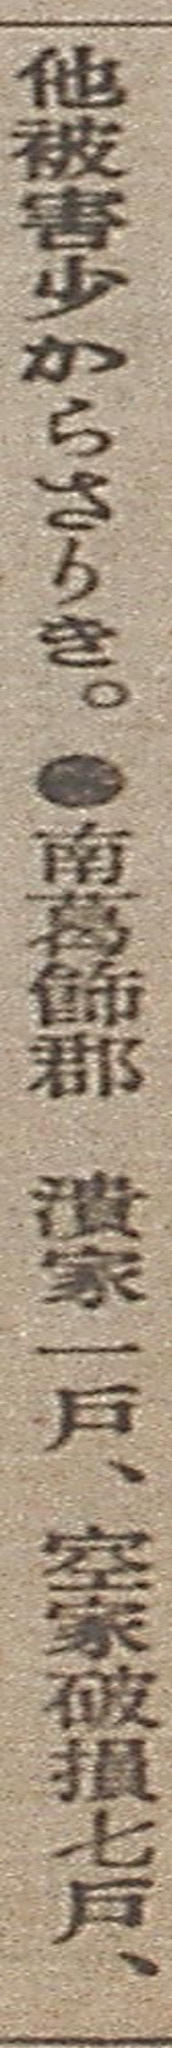他被害少からさりき。●南葛飾郡潰家一戸、空家破損七戸、
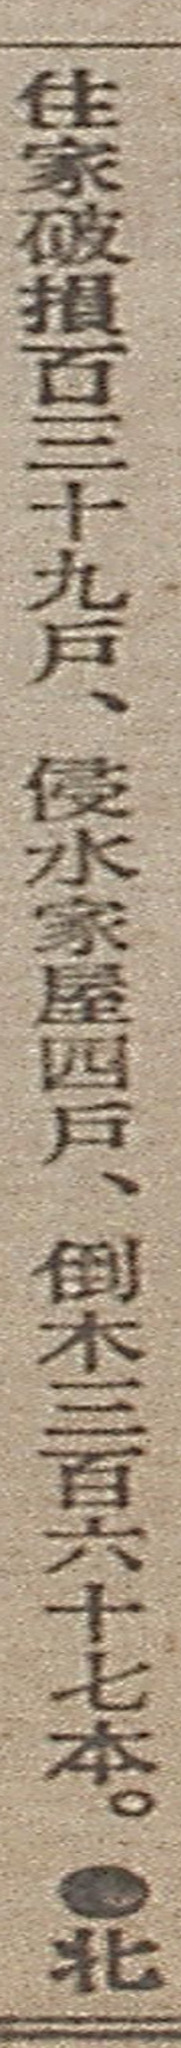住家破損百三十九戸、浸水家屋四戸、倒木三百六十七本。●北
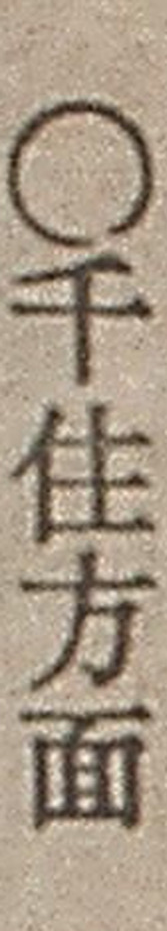〇千住方面
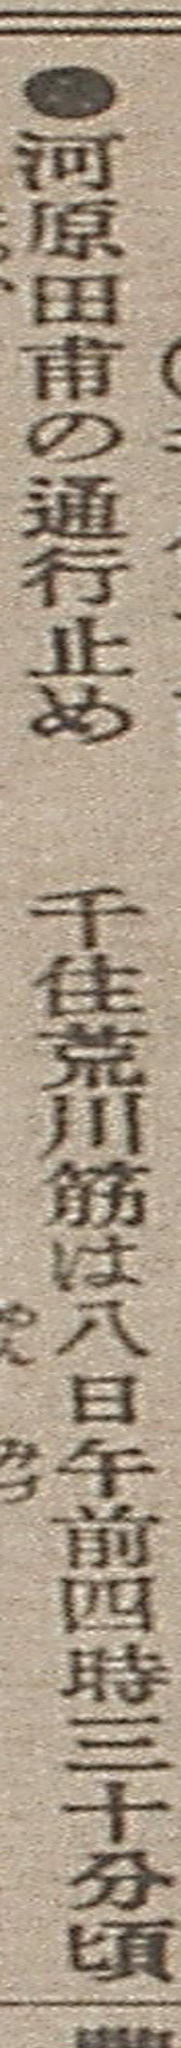●河原田甫の通行止め千住荒川筋は八日午前四時三十分頃
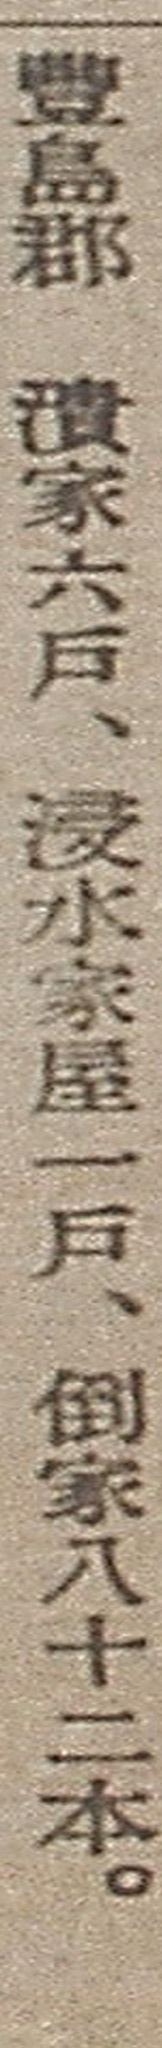豊島郡潰家六戸、浸水家屋一戸、倒家八十二本。
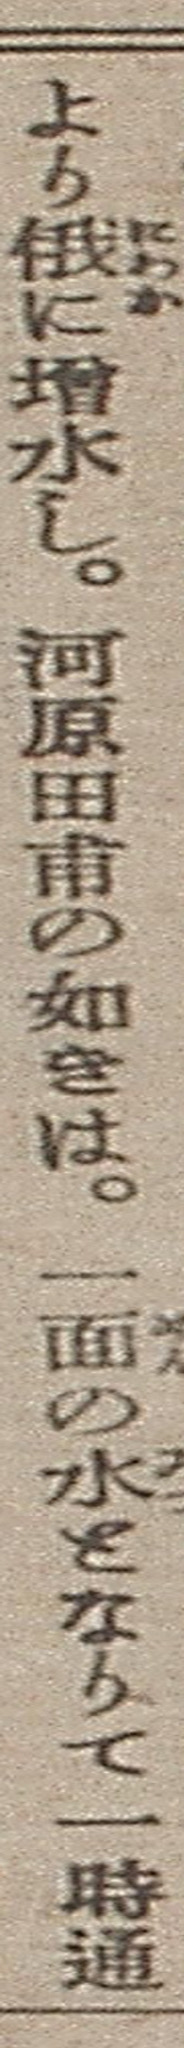より俄に増水し。河原田甫の如きは。一面の水となりて一時通
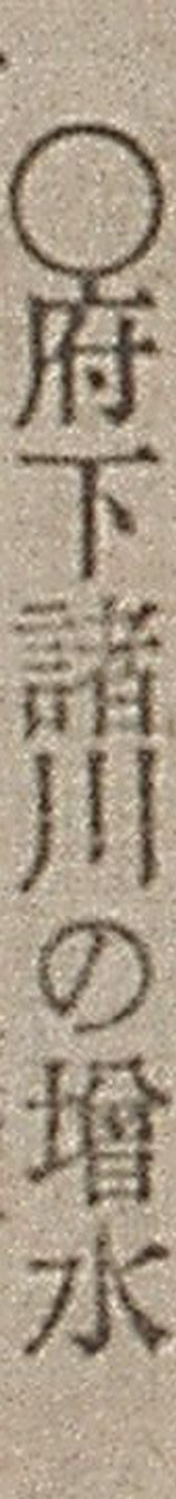〇府下諸川の増水
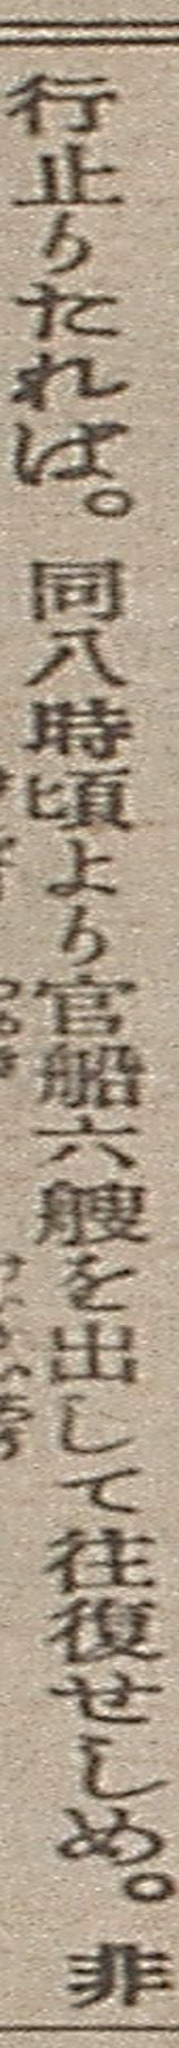行止りたれば。同八時頃より官船六艘を出して往復せしめ。非
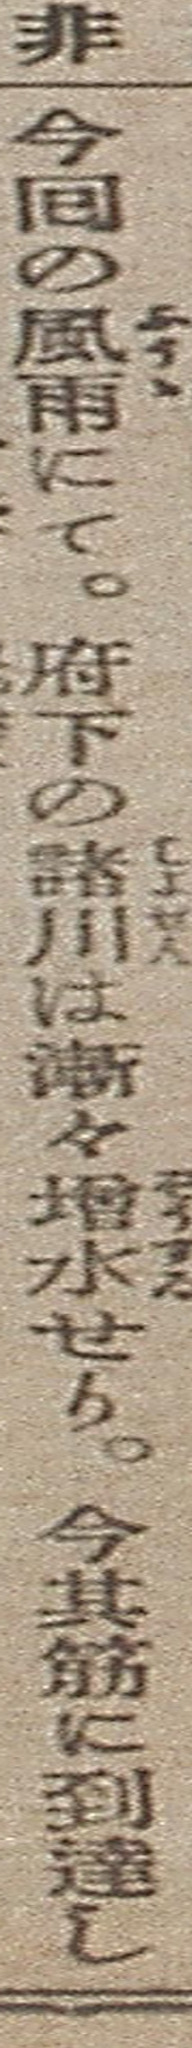今回の風雨にて。府下の諸川は漸々増水せり。今其筋に到達し
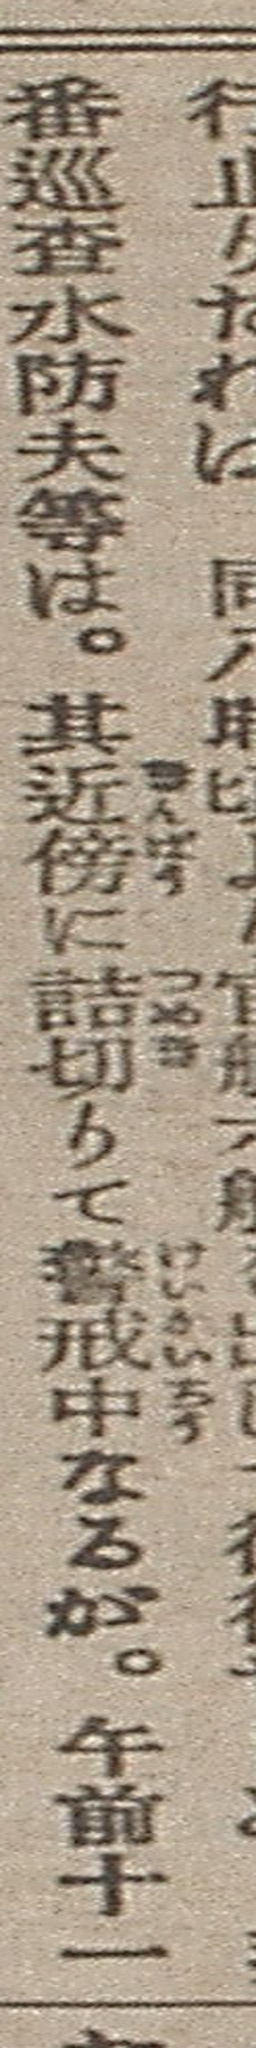番巡査水防夫等は。其近傍に詰切りて警戒中なるが、午前十一
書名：風俗畫報臨時増刊第百九十九號　明治三十二年十月各地災害圖會（前編之續）
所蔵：東京大学地震研究所図書室 Earthquake Research Institute Library, The University of Tokyo, JAPAN
